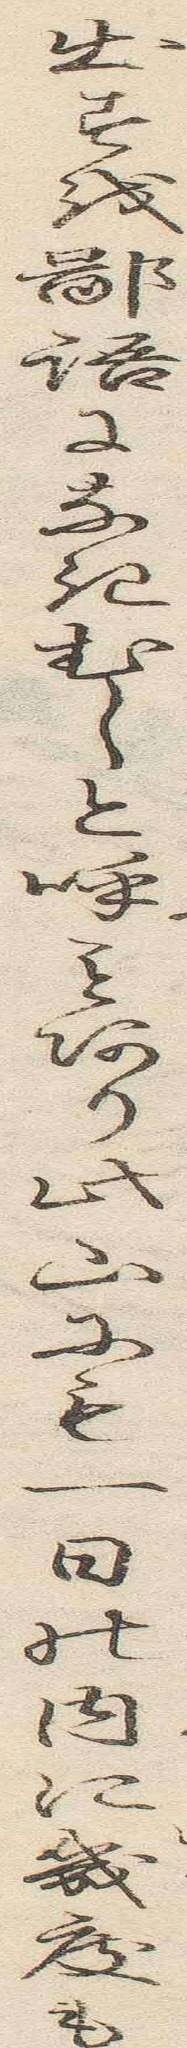出すを鄙語になきむしと呼ことあり此山にも一日の内に幾度も
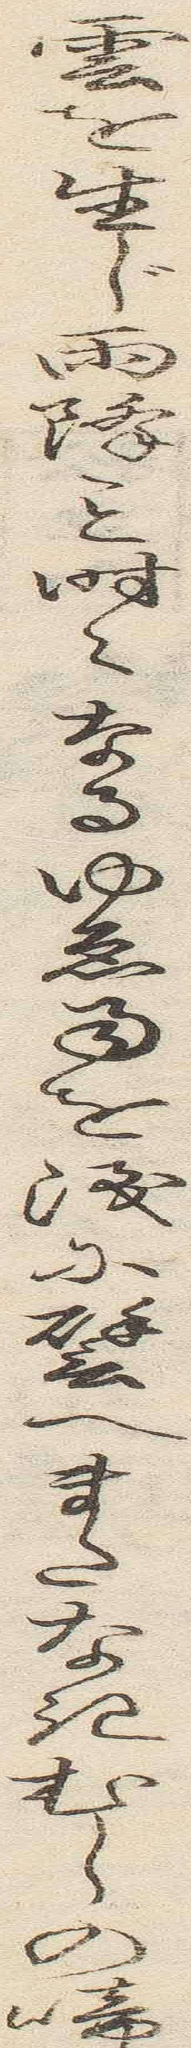雲を生じ雨降こと时〻なるゆゑ雨を涙に譬へまたなきむしの啼
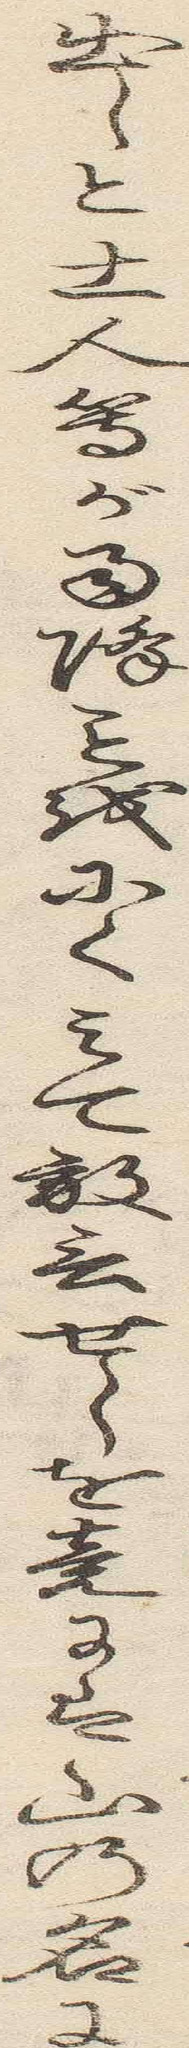出しと土人等が雨降ことをにくみて放言せしを竟には山の名に
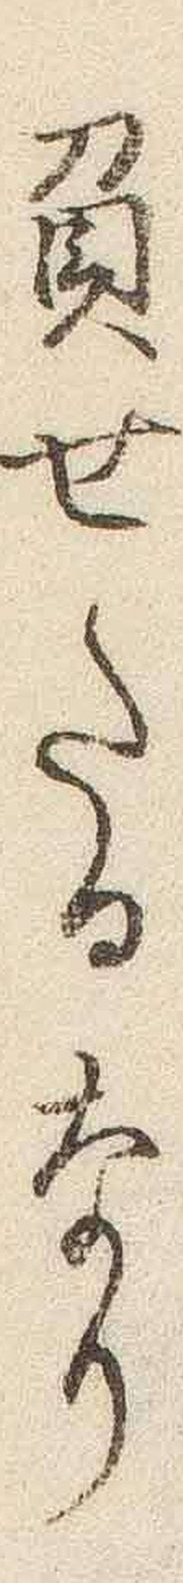負せたるなり
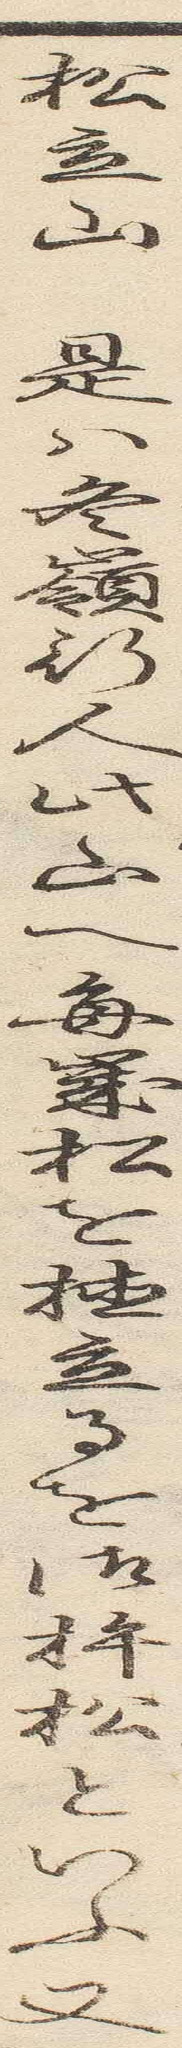松立山是は冬嶺行人此山へ毎歳松を植立るを御杵松といふ又
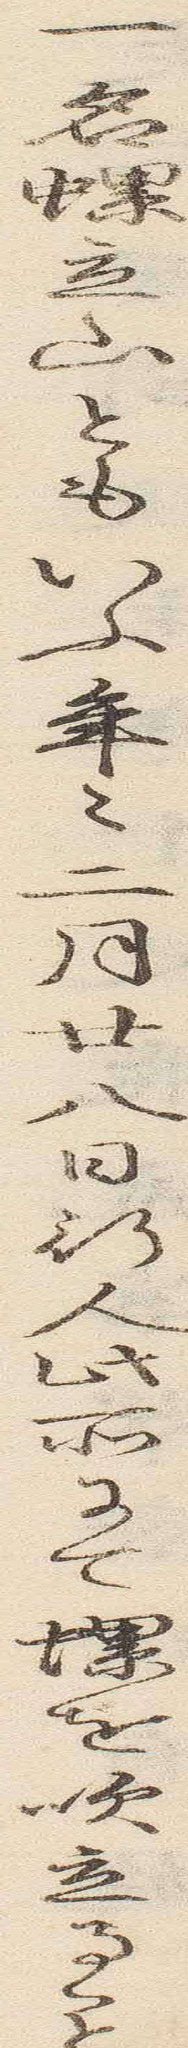一名螺立山ともいふ年〻二月廿八日行人此所にて螺を吹立ること
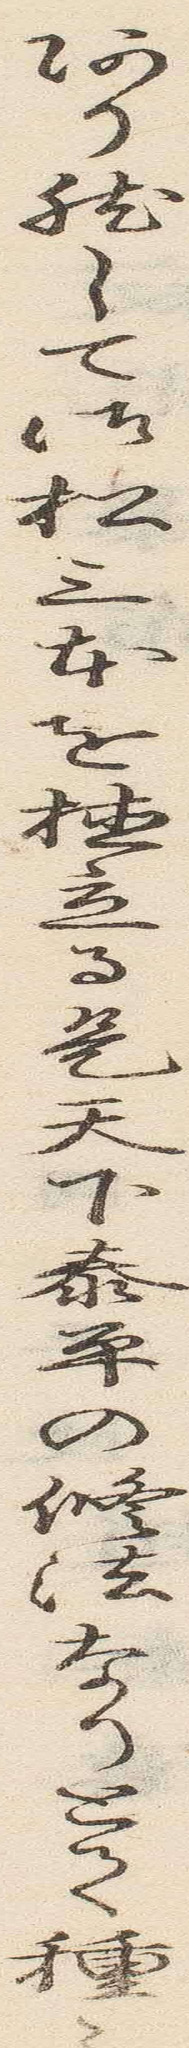あり然して御松三本を植立る是天下泰平の修法なりとて種〻
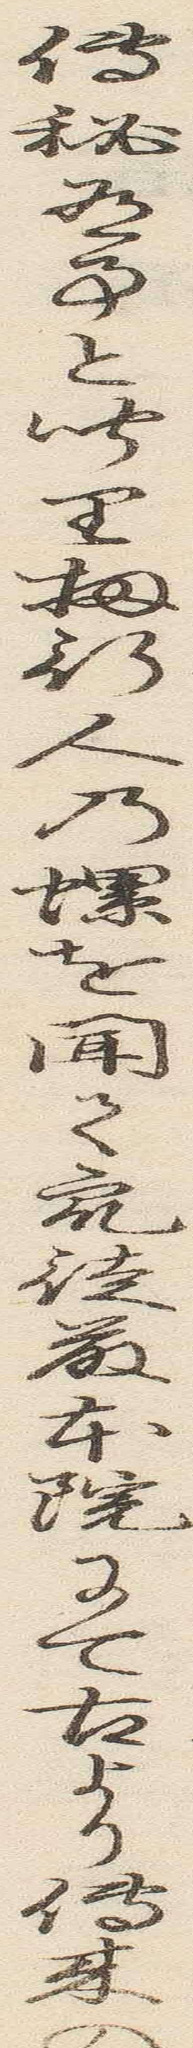傳秘有事と聞り偖行人の螺を聞て衆徒藤本院にて古より傳來の
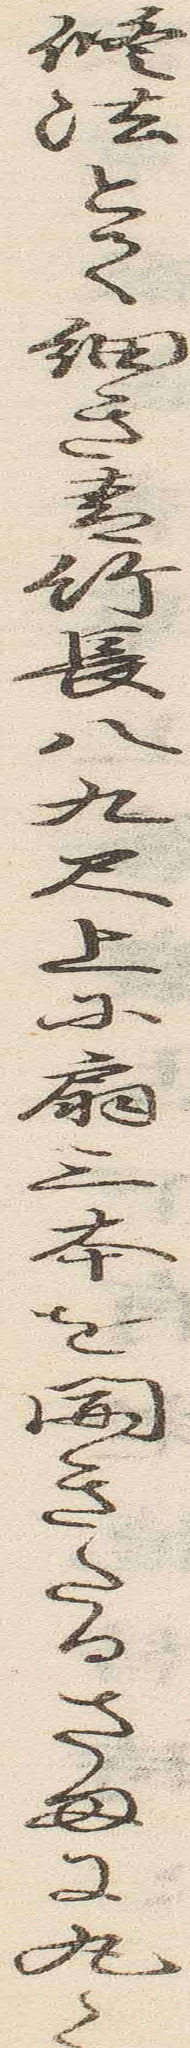修法とて細き青竹長八九尺上に扇三本を開きたるさまに丸く
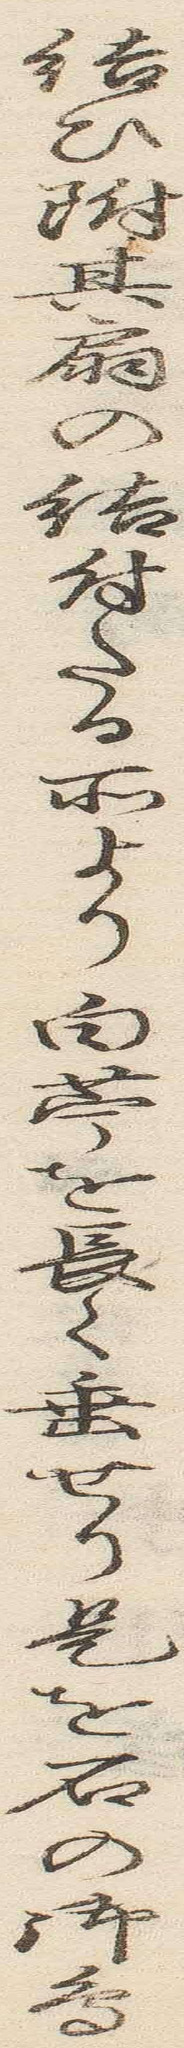結ひ附其扇の結付たる所より白苧を長く垂せり是を石の御鳥
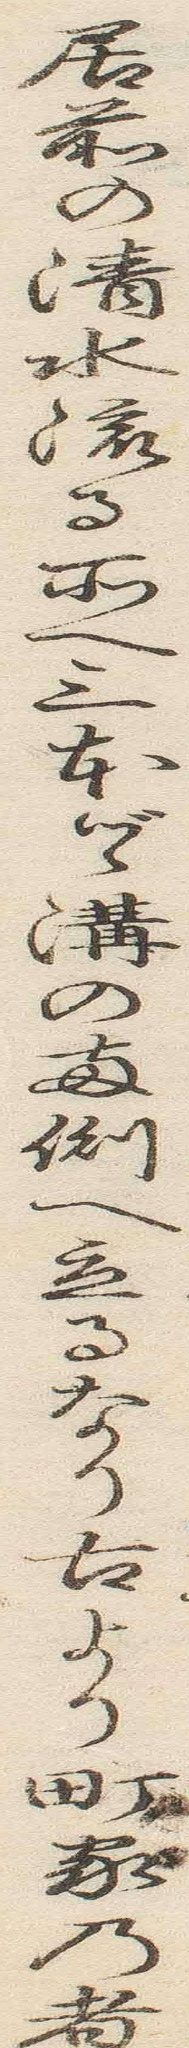居前の清水流る所へ三本づゝ溝の両側へ立るなり古より町家の者
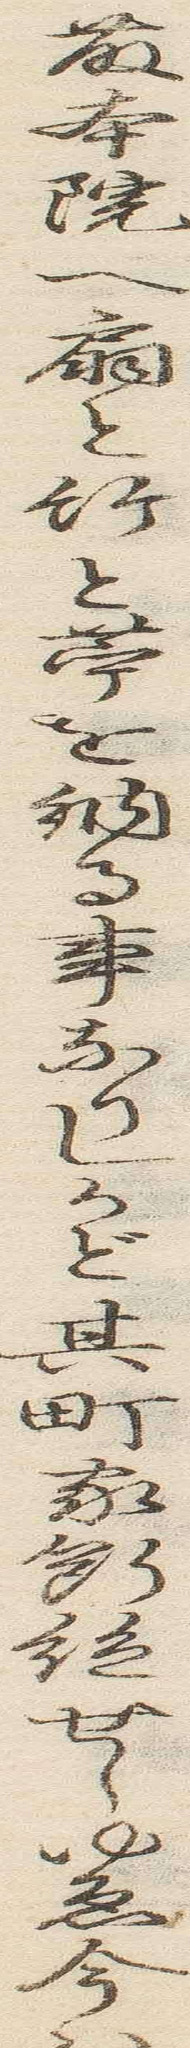藤本院へ扇と竹と苧を納る事なりしかど其町家断絶せしゆゑ今は
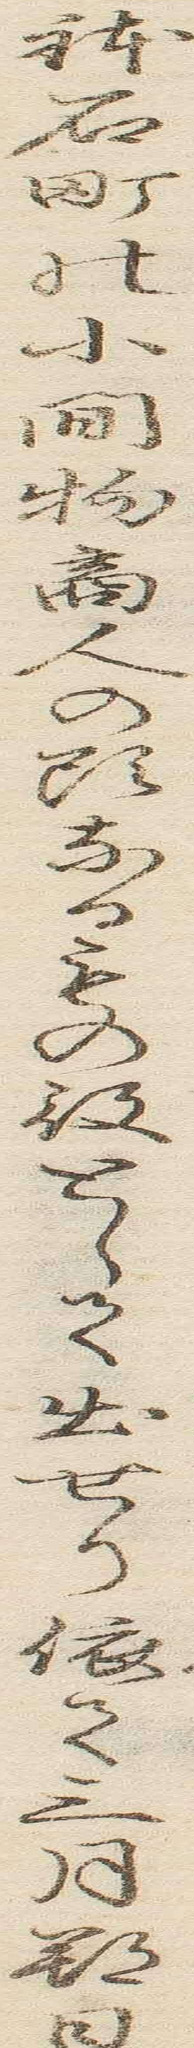鉢石町の小間物商人の頭なることの役として出せり依て三月朔日
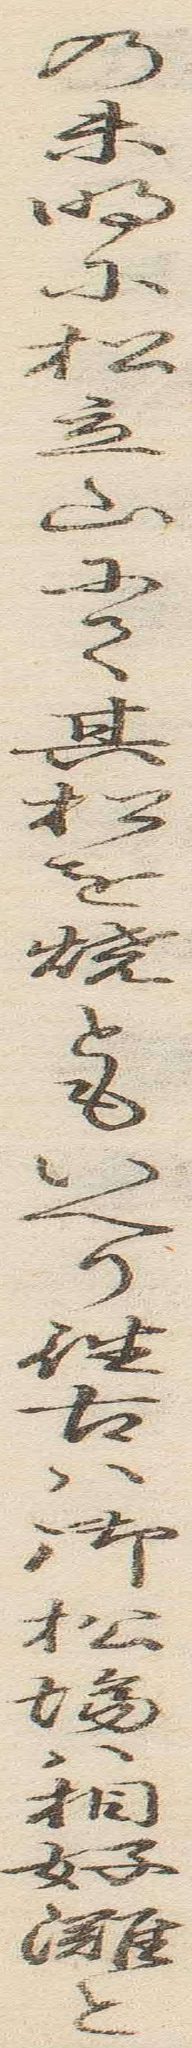の未明に松立山にて其松を焼ともいへり徃古は御松塲は相好灘と
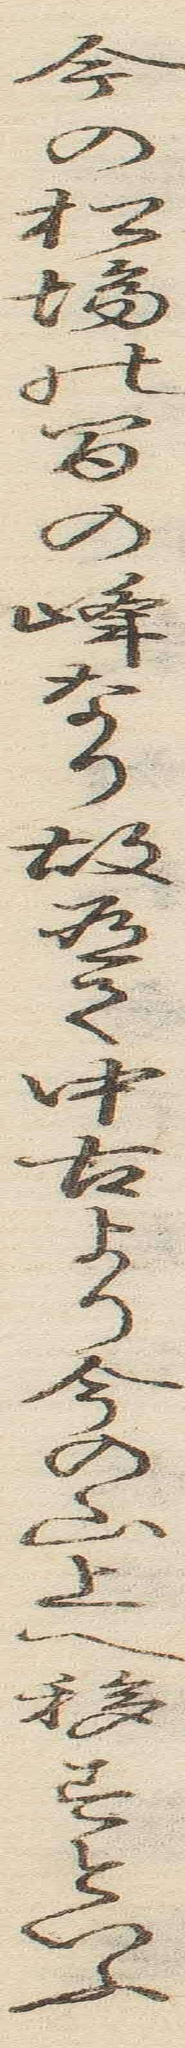今の松塲の間の峰なり故有て中古より今の山上へ移すといふ
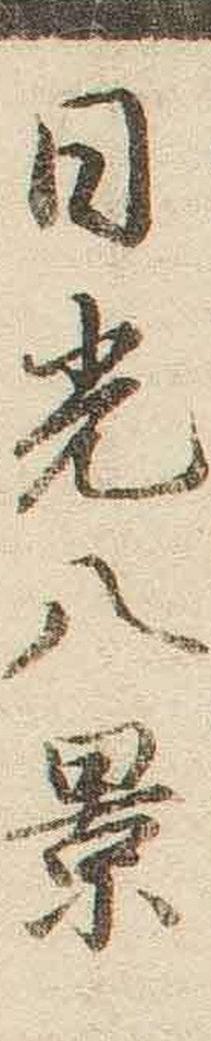日光八景
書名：日光山志
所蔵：東京学芸大学附属図書館 国文学研究資料館
